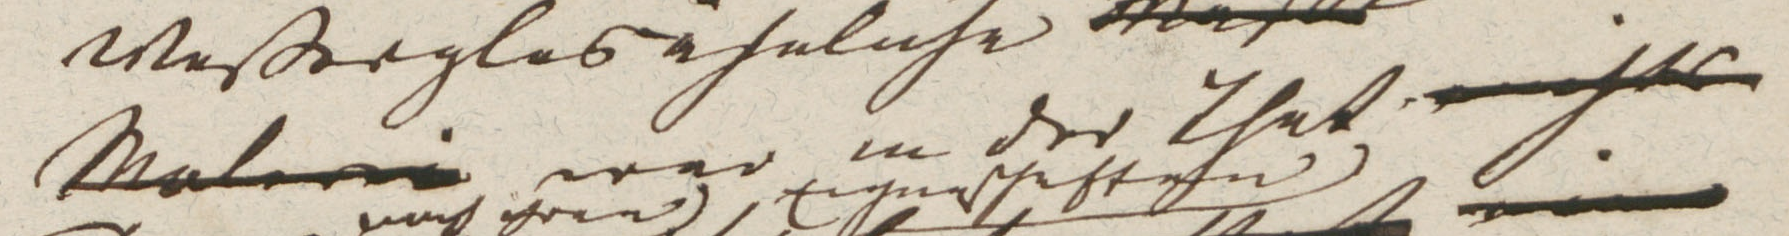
Malerei war in der That nichts
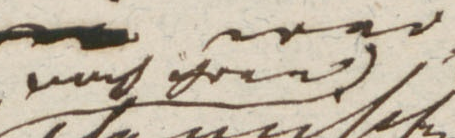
nach ihren
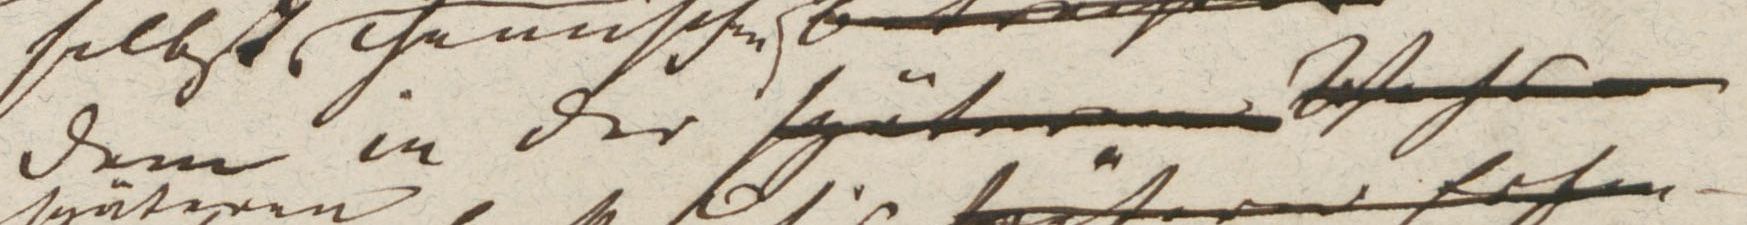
dem in der späteren Wachs-
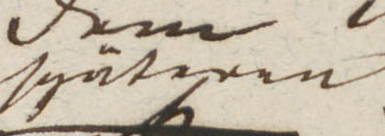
späteren
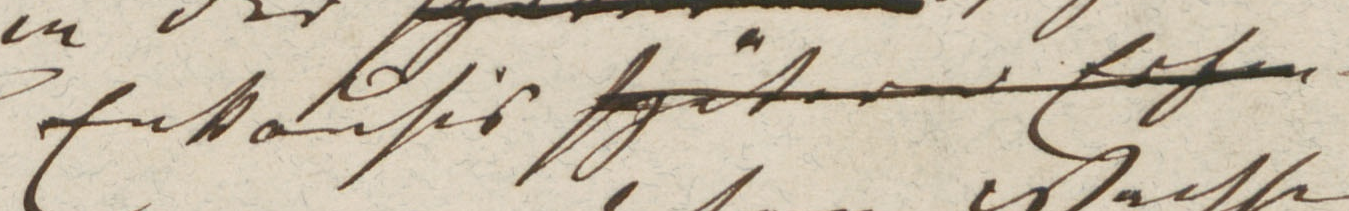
Enkausis späteren Erfin-
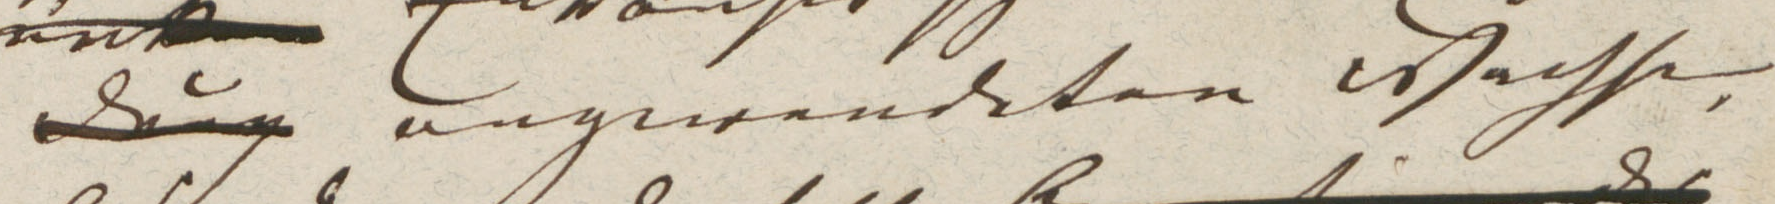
dung angewendeten Wachse,
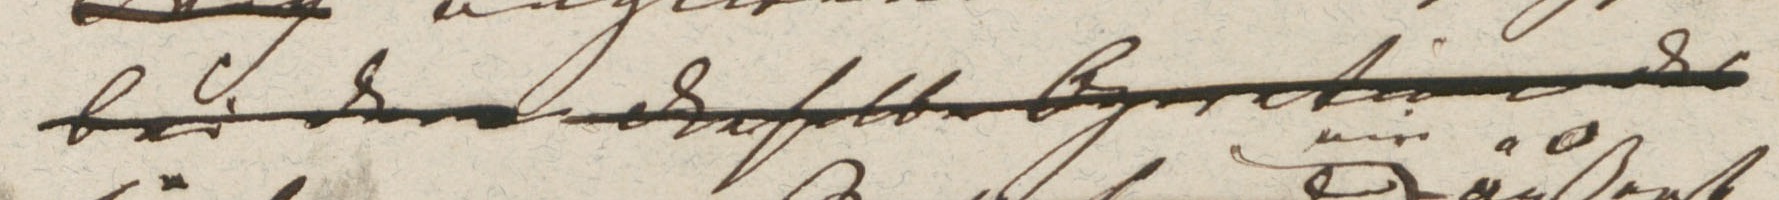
bei dem dieselbe Operation des
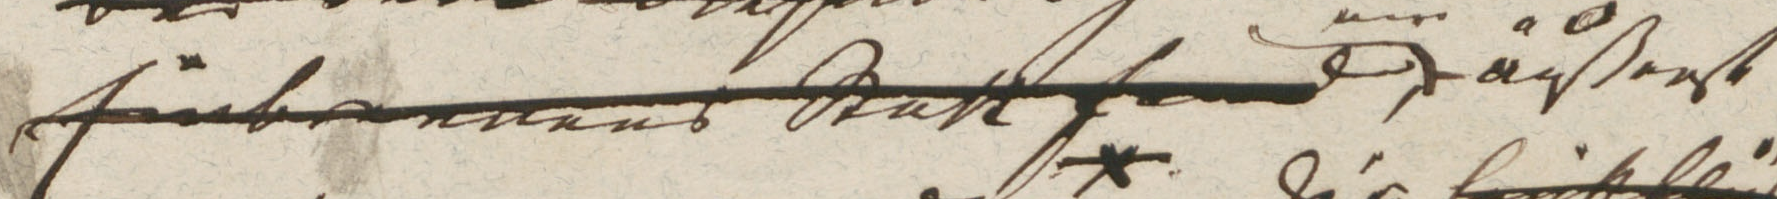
Einbrennens Statt fand, ein äusserst
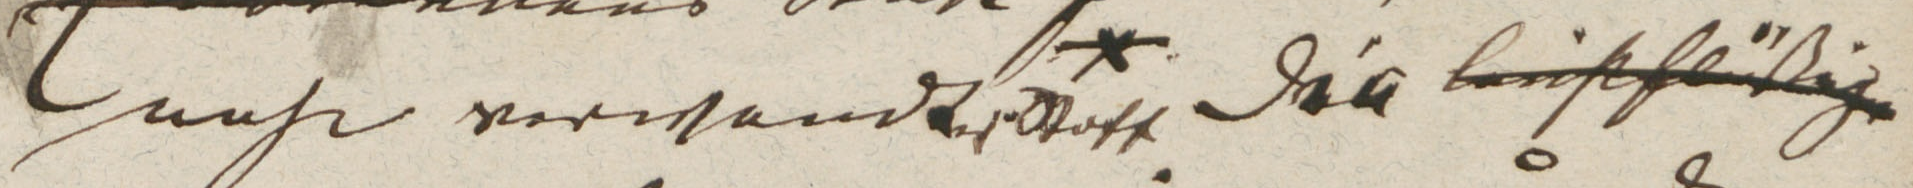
nahe verwandter. Stoff % Dasie leichtflüssige
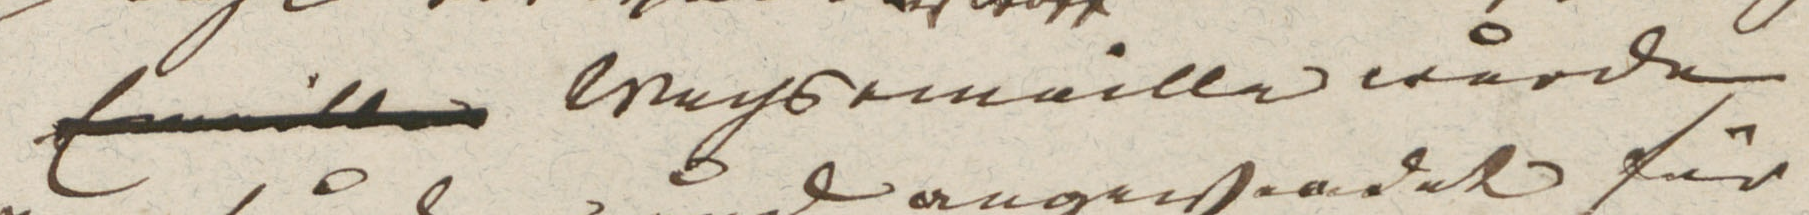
Emaille Wachsemaille wurde
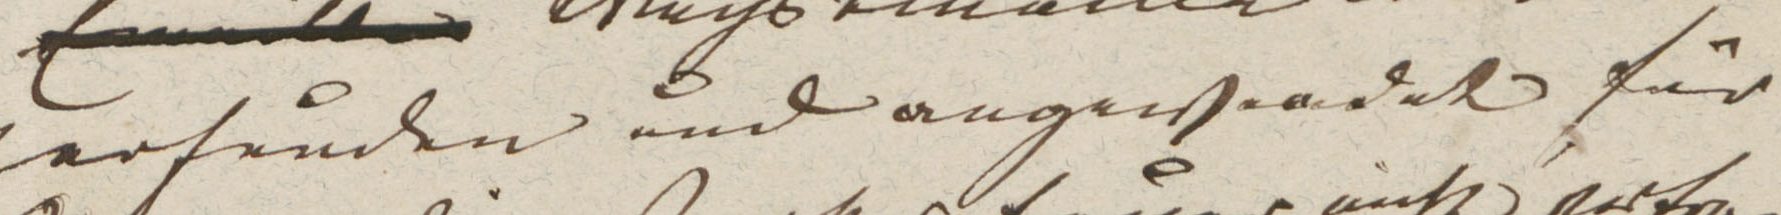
erfunden und angewendet für
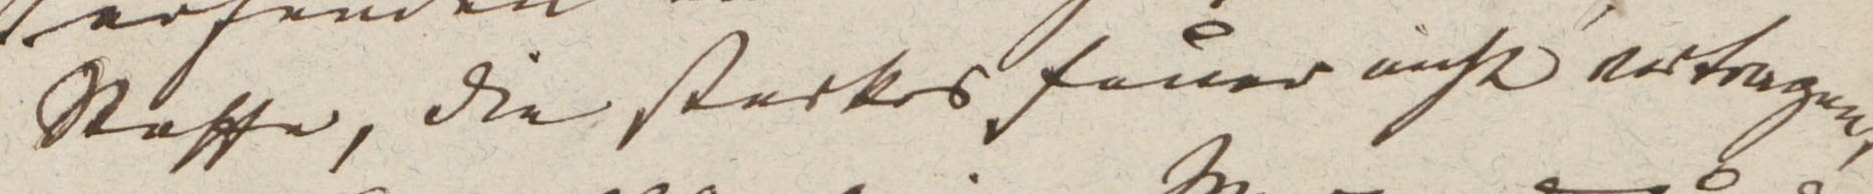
Stoffe, die starkes Feuer nicht vertrgen,
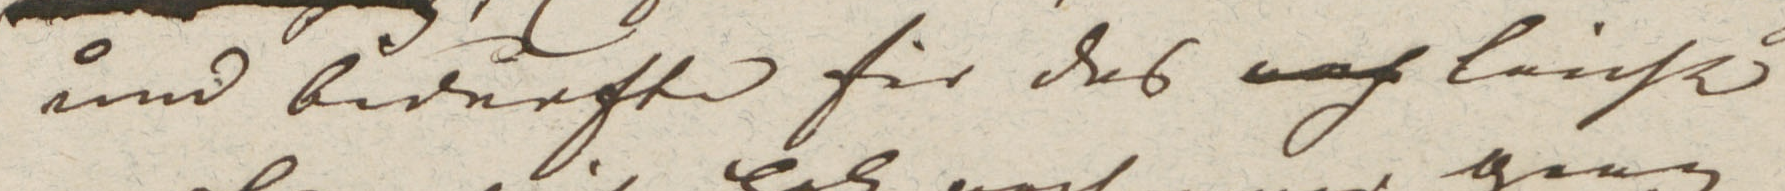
und bedurfte für das noch leicht
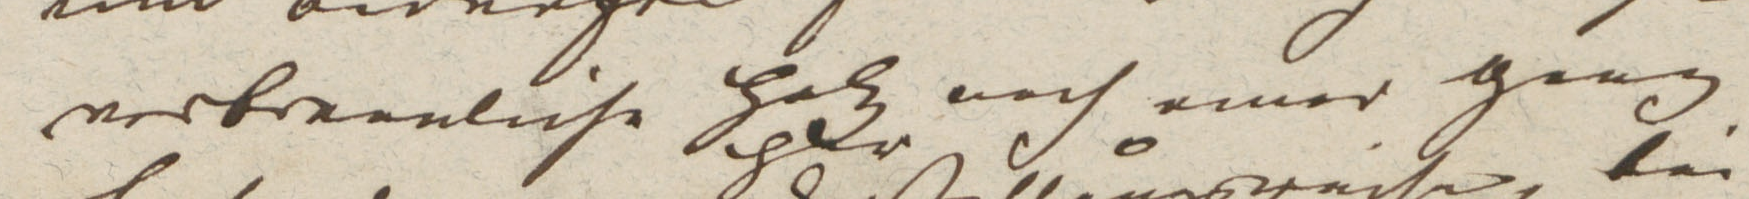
verbrennliche Holz noch einer ganz
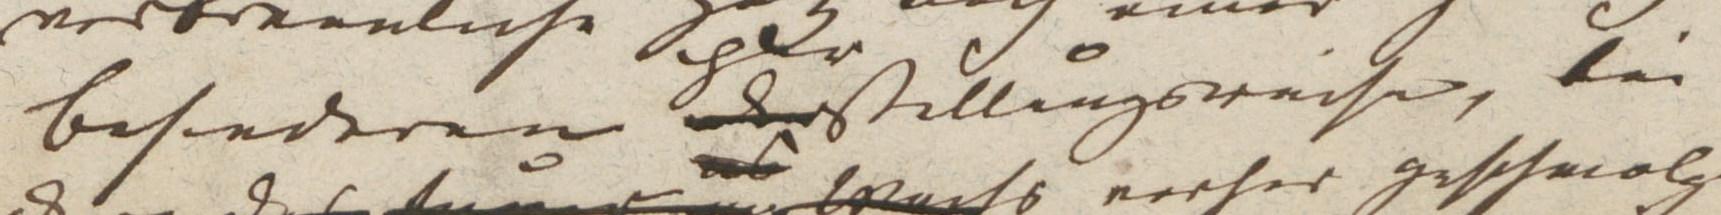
besonderen DarHerstellungsweise, bei
